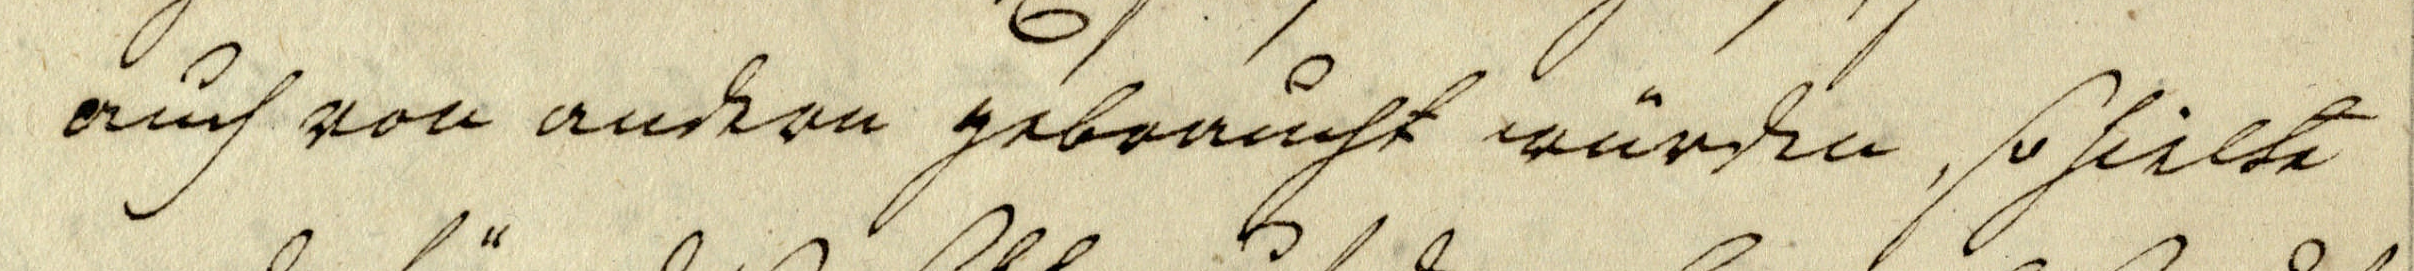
auch von andern gebraucht würden, so hielte
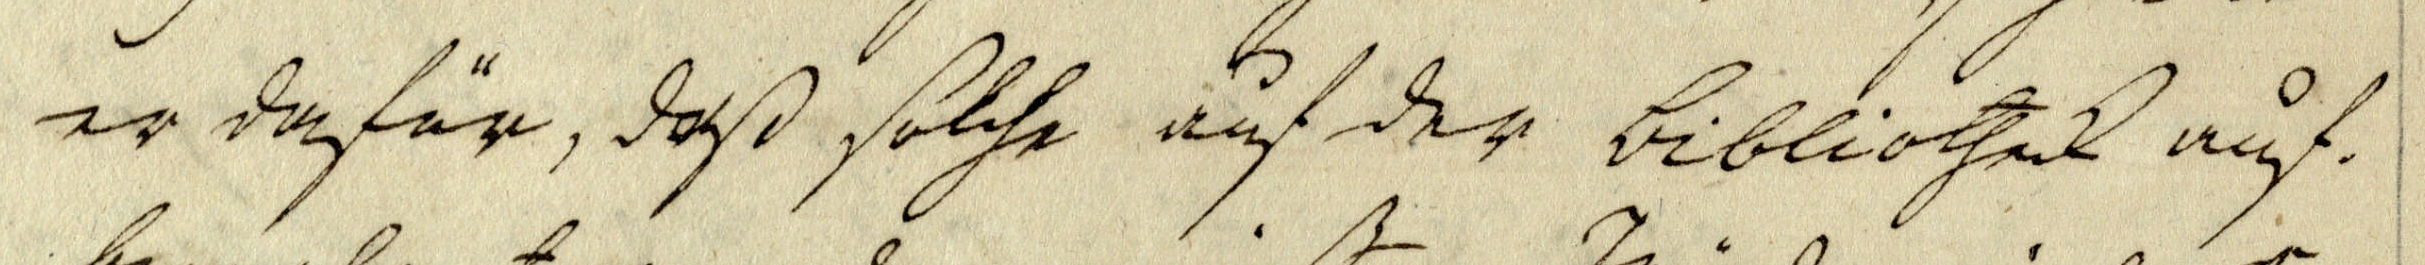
er dafür, daß solche auf der Bibliotheck auf¬
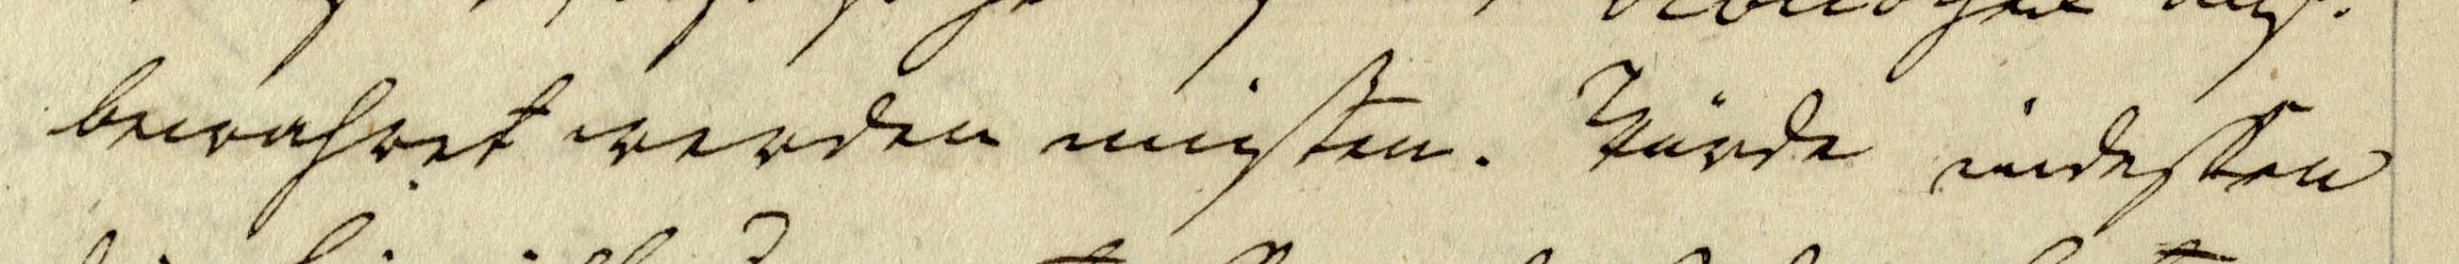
bewahret werden müßten. Würde indessen
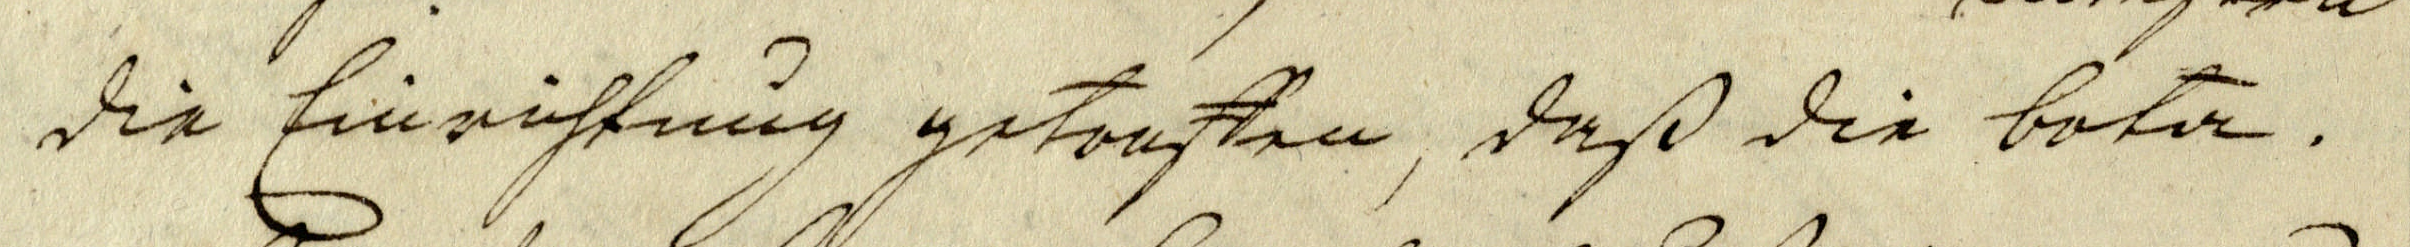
die Einrichtung getroffen, daß die bota¬
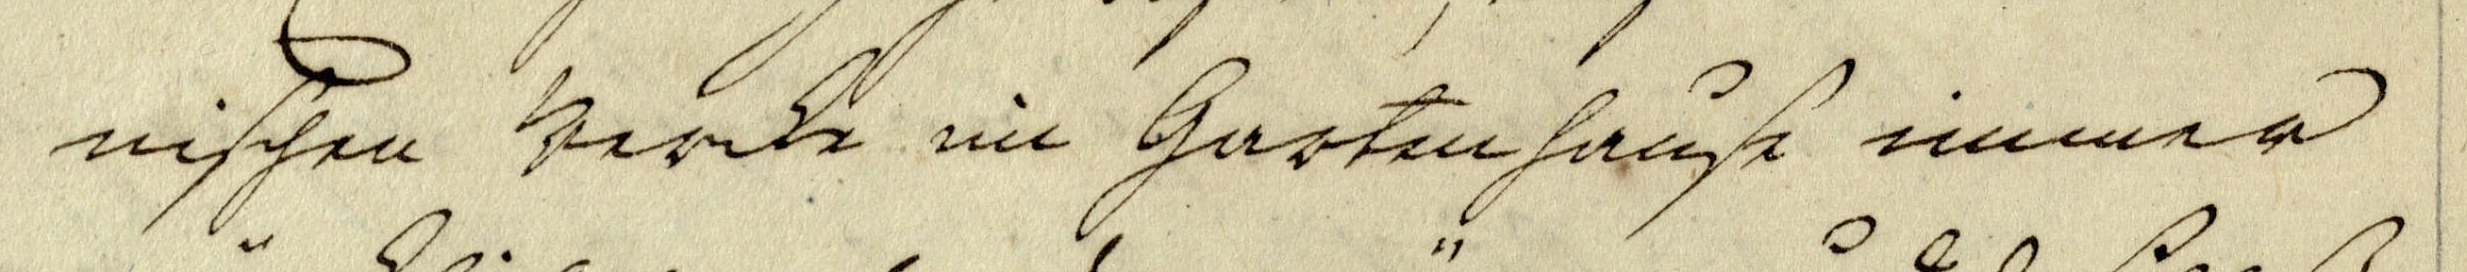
nischen Wercke in Gartenhause immer
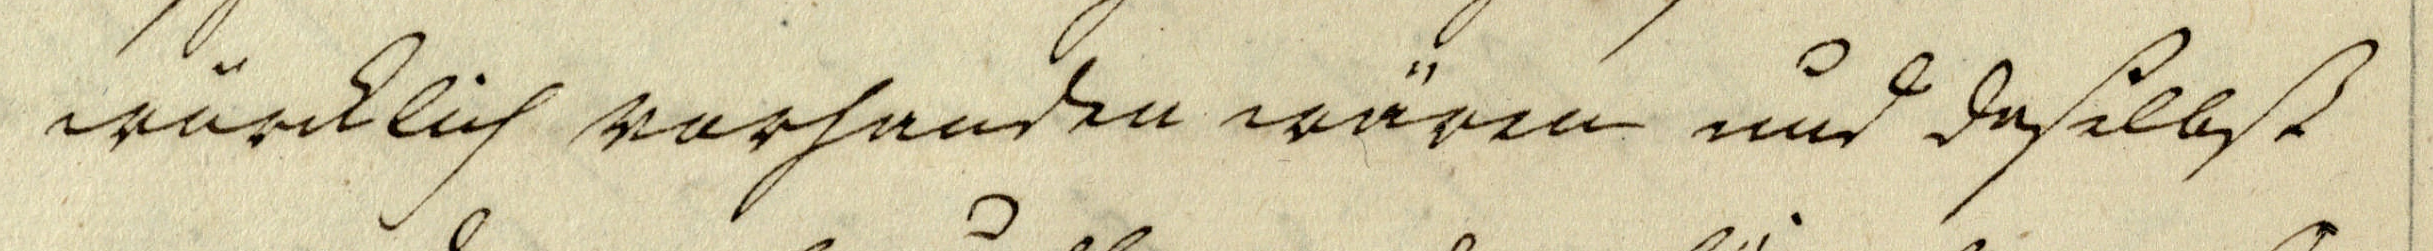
würcklich vorhanden wären und daselbst
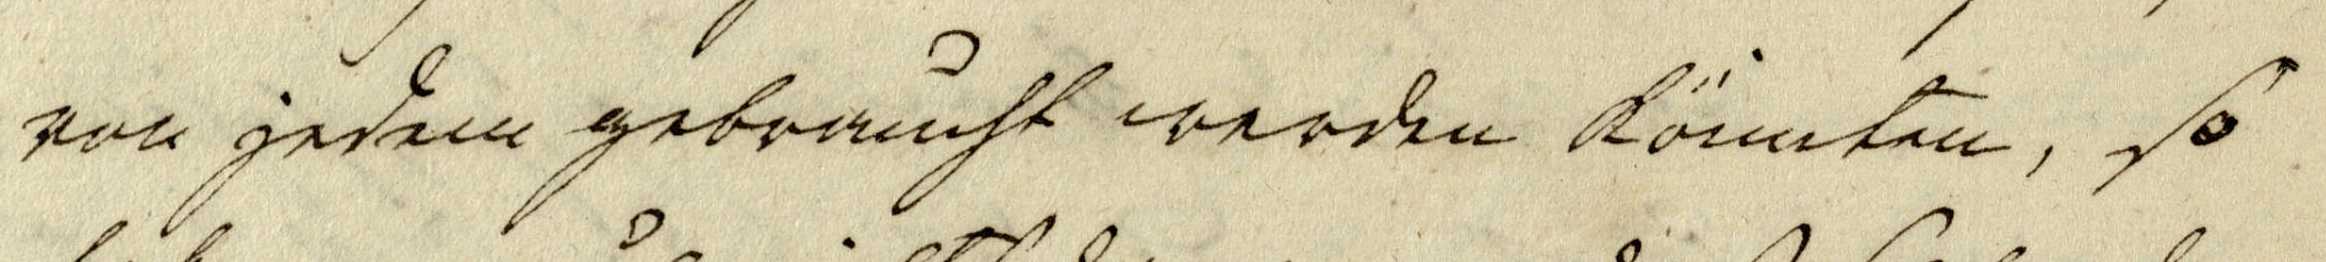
von jedem gebraucht werden könnten, so
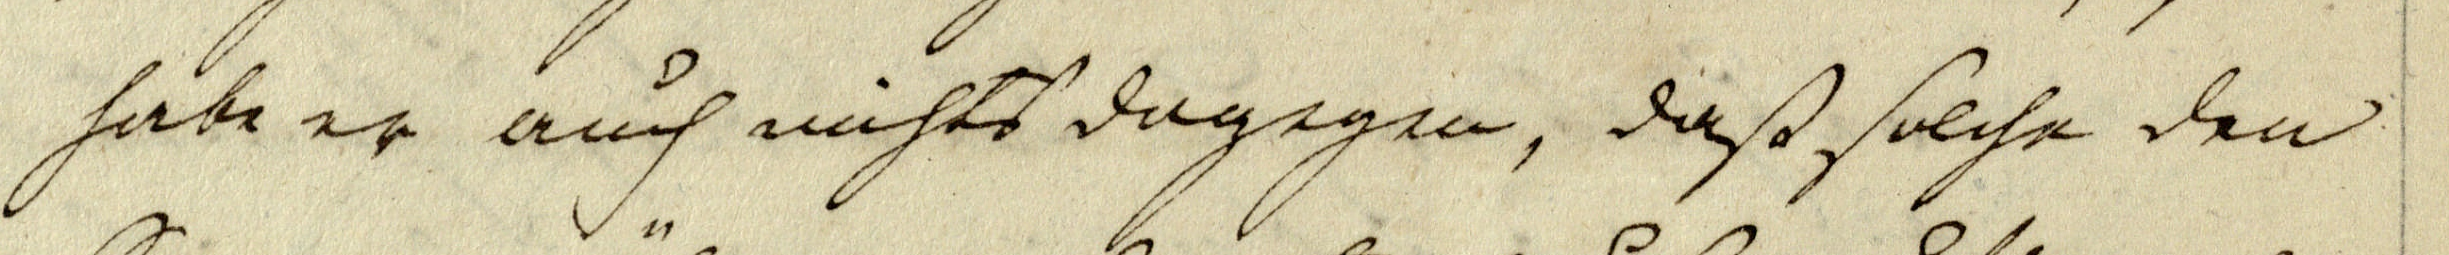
habe er auch nichts dagegen, daß solche den
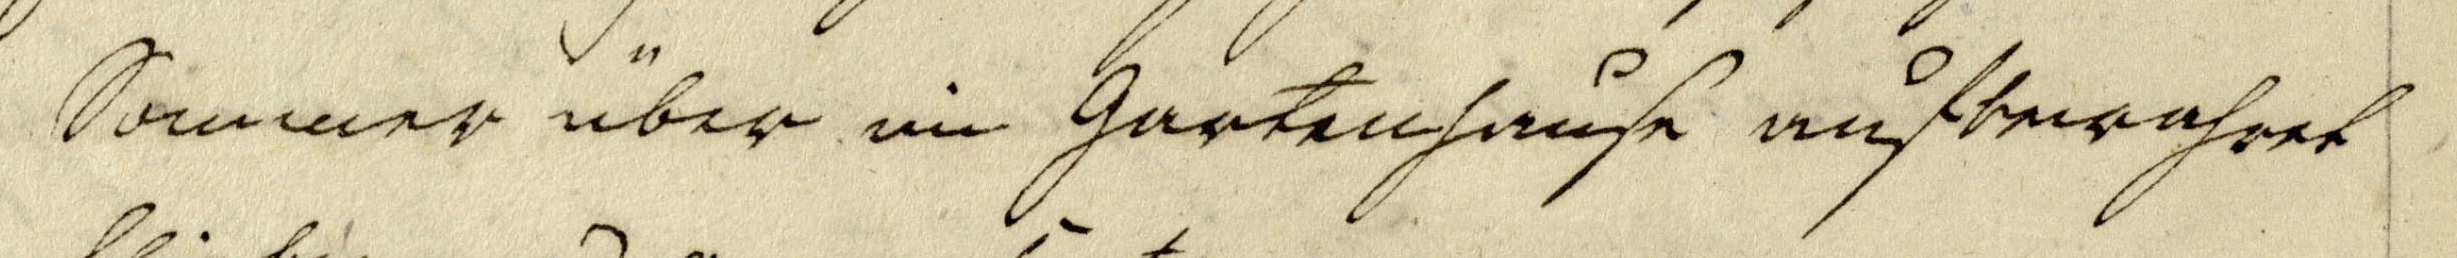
Sommer über im Gartenhause aufbewahret
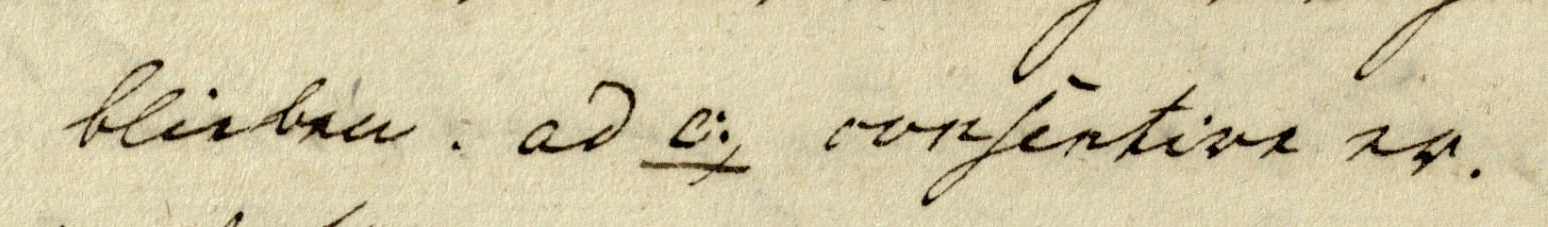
blieben. ad c., consentire er.
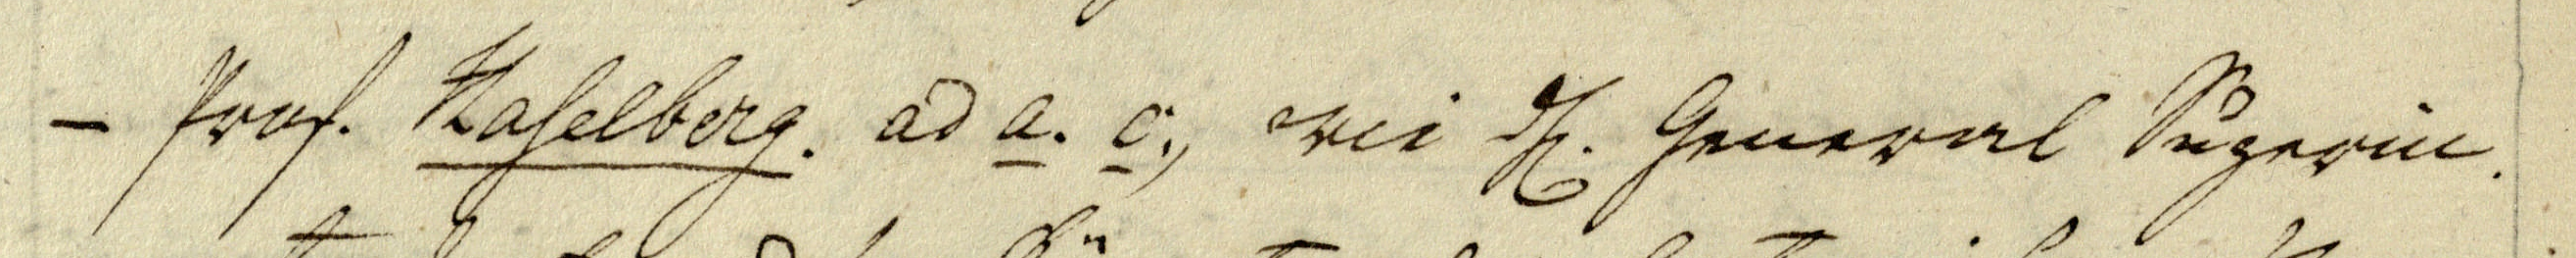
Prof. Haselberg. ad a. c., wie dh. General Superin¬
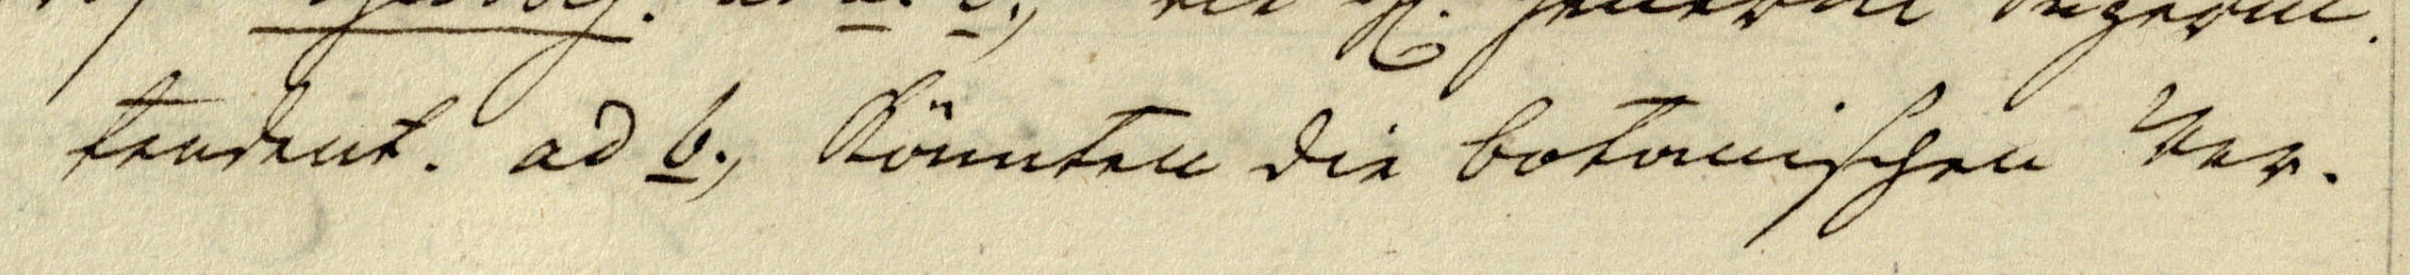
tendent. ad b., könnten die botanischen Wer¬
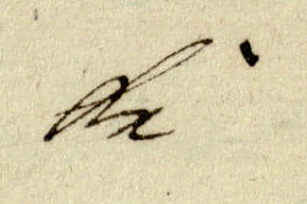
ke
